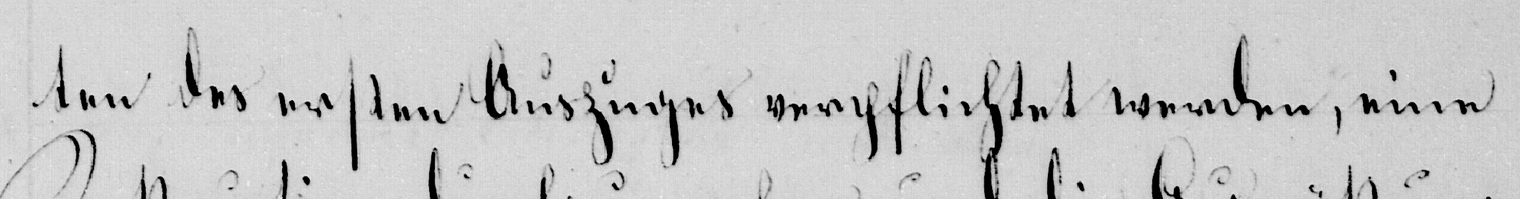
ten des ersten Auszuges verpflichtet werden, eine
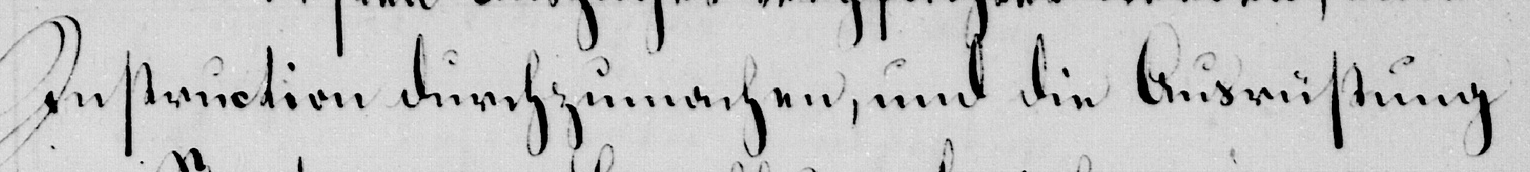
Instruction durchzumachen, und die Ausrüstung
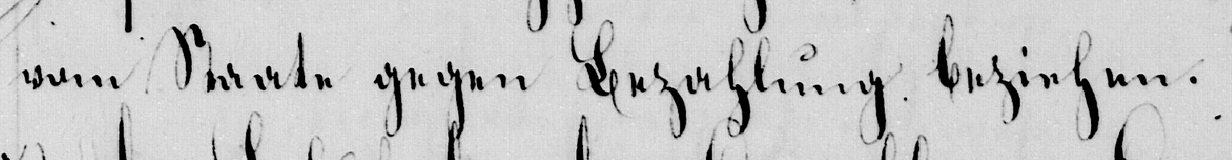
vom Staate gegen Bezahlung beziehen.
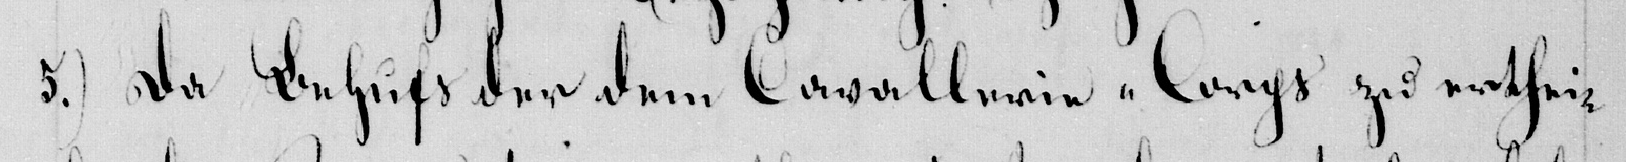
5.) Da Behufs der dem Cavallerie-Corps zu erthei¬
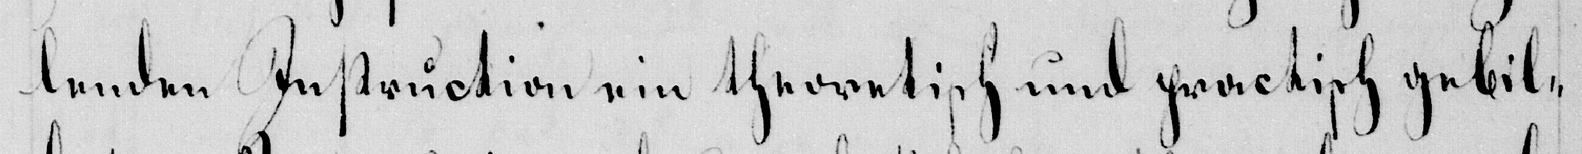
lenden Instruction ein theoretisch und practisch gebil¬
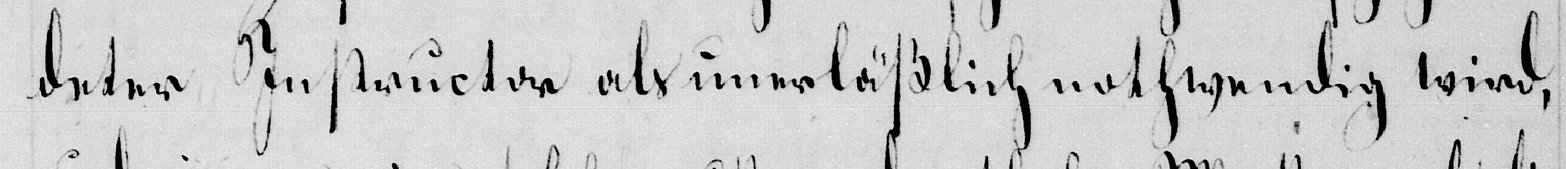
deter Instructor als unerläßlich nothwendig wird,
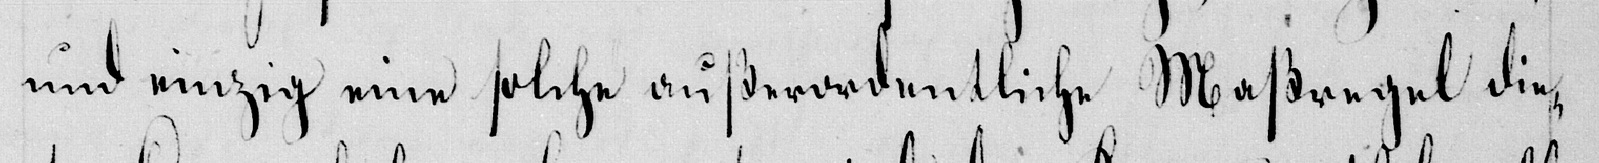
und einzig eine solche außerordentliche Maßregel die¬
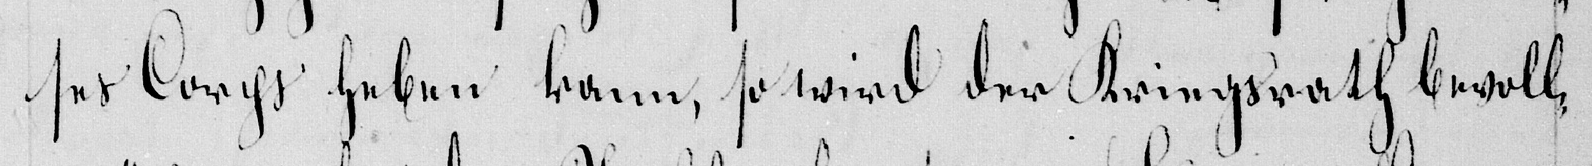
ses Corps heben kann, so wird der Kriegsrath bevoll¬
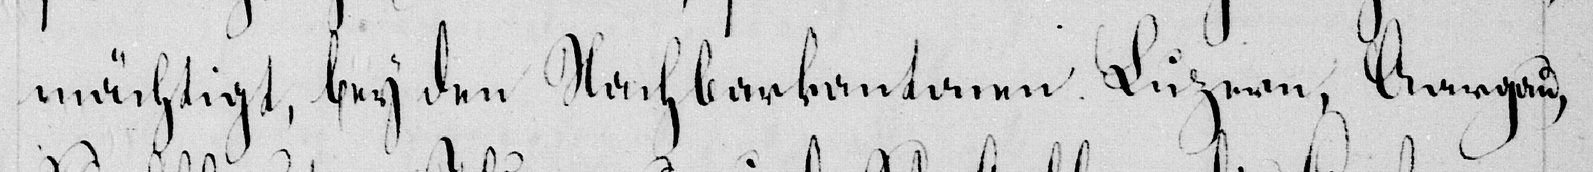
mächtigt, bey den Nachbarkantonen Luzern, Aargau,
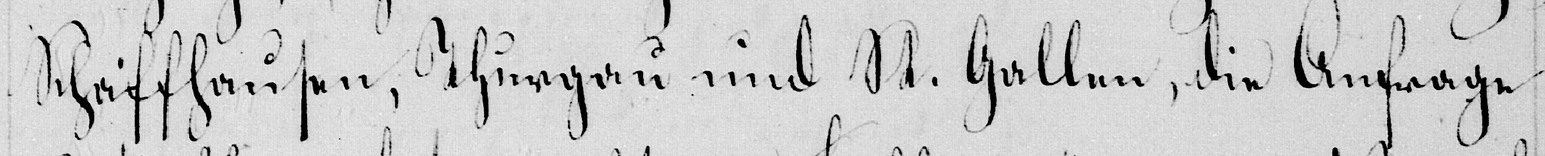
Schaffhausen, Thurgau und St. Gallen, die Anfrage
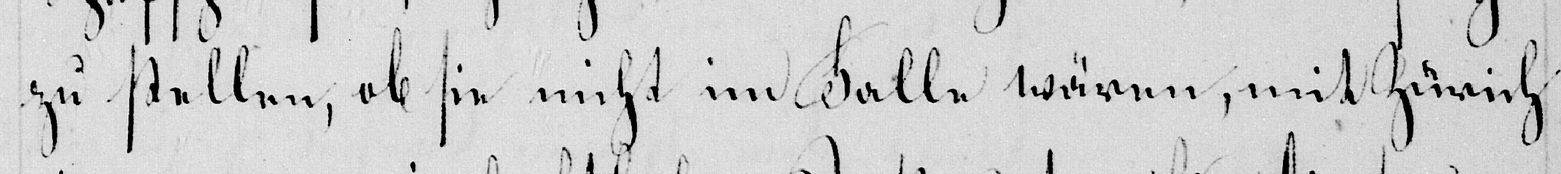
zu stellen, ob sie nicht im Falle wären, mit Zürich
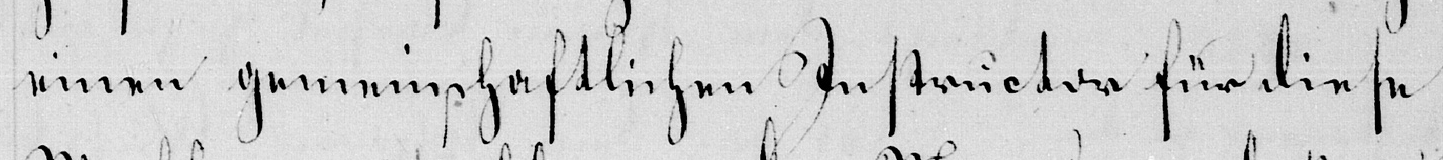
einen gemeinschaftlichen Instructor für diese
